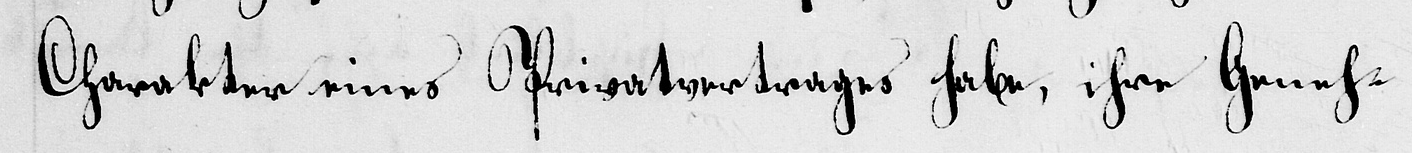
Charakter eines Privatvertrages habe, ihre Geneh¬
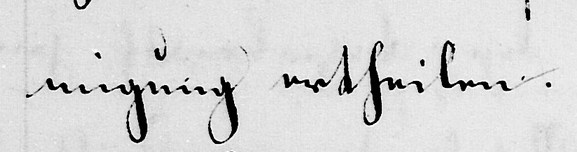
migung ertheilen.
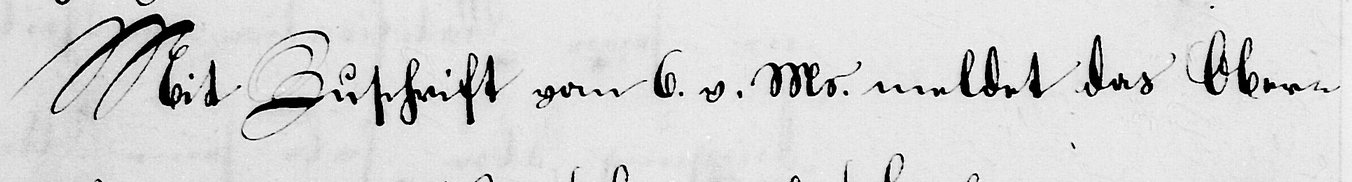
Mit Zuschrift vom 6. v. Ms. meldet das Ober¬
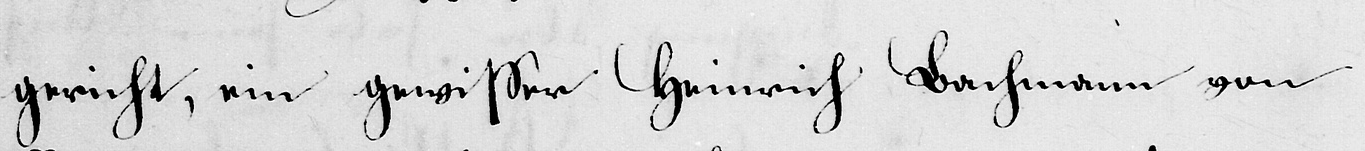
gericht, ein gewisser Heinrich Bachmann von
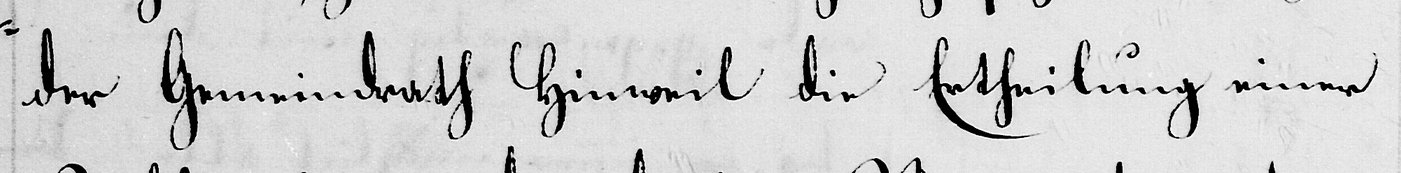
der Gemeindrath Hinweil die Ertheilung einer
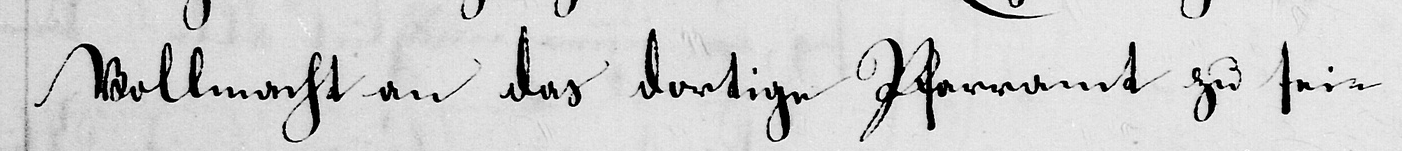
Vollmacht an das dortige Pfarramt zu sei¬
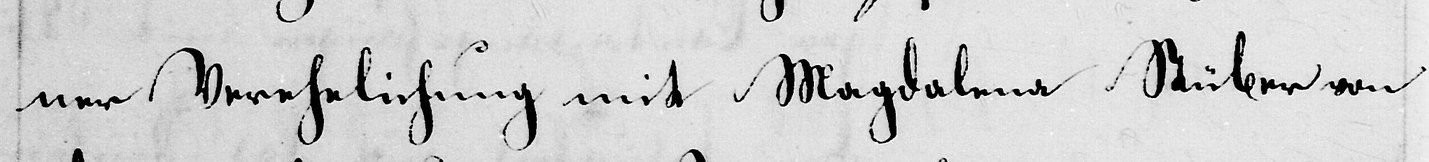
ner Verehelichung mit Magdalena Stüber von
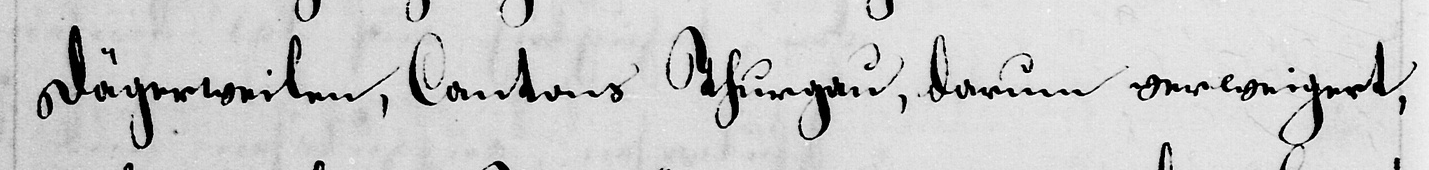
Dägerweilen, Cantons Thurgau, darum verweigert,
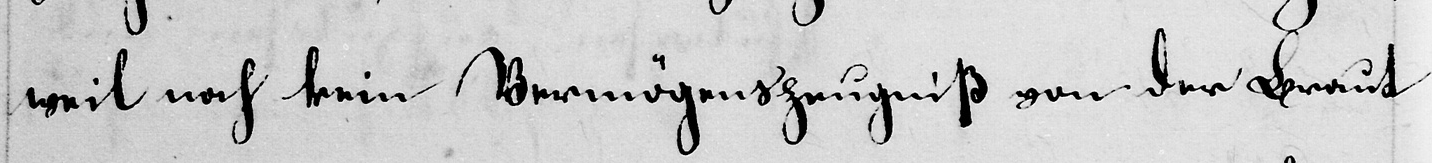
weil noch kein Vermögenszeugniß von der Braut
